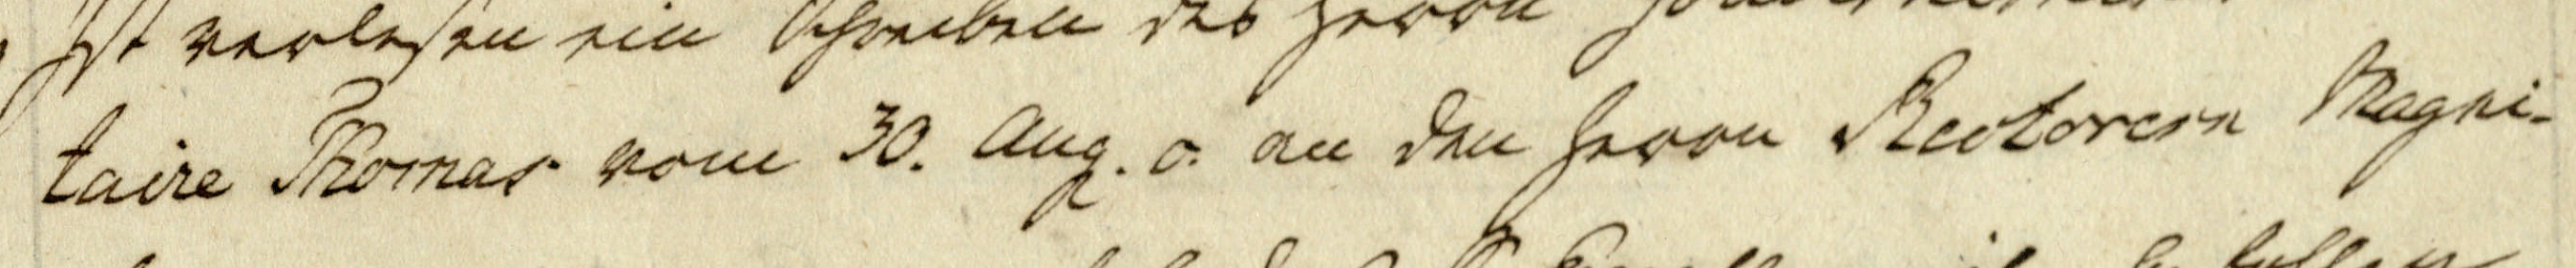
taire Thomas vom 30. Aug. c. an den herrn Rectorem Magni¬
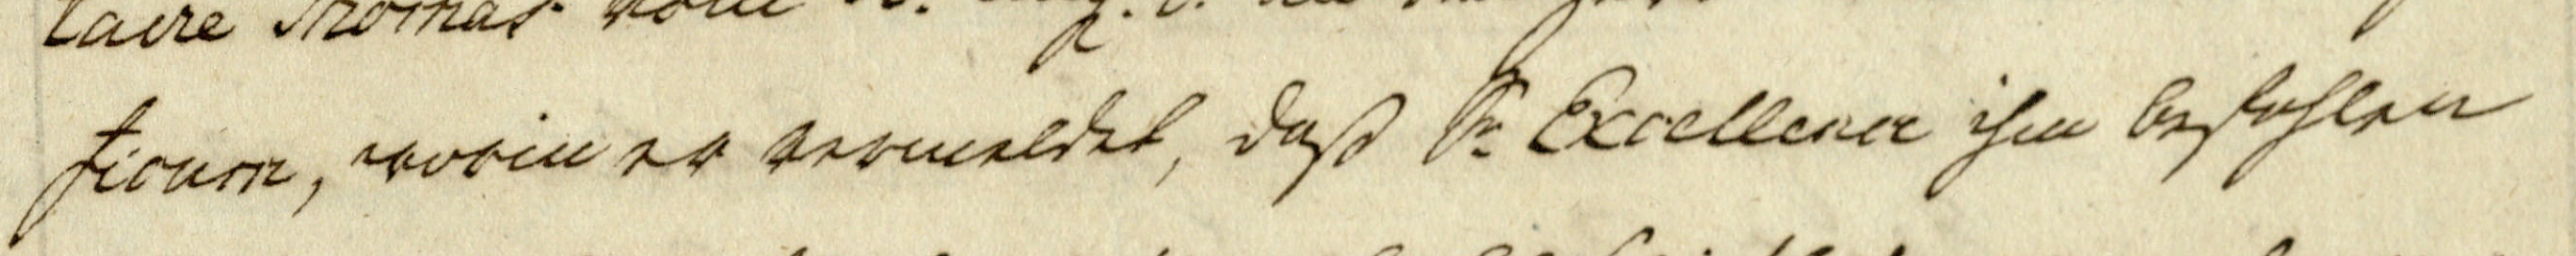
ficum, worin er vermeldet, daß Sr. Excellence ihm befohlen
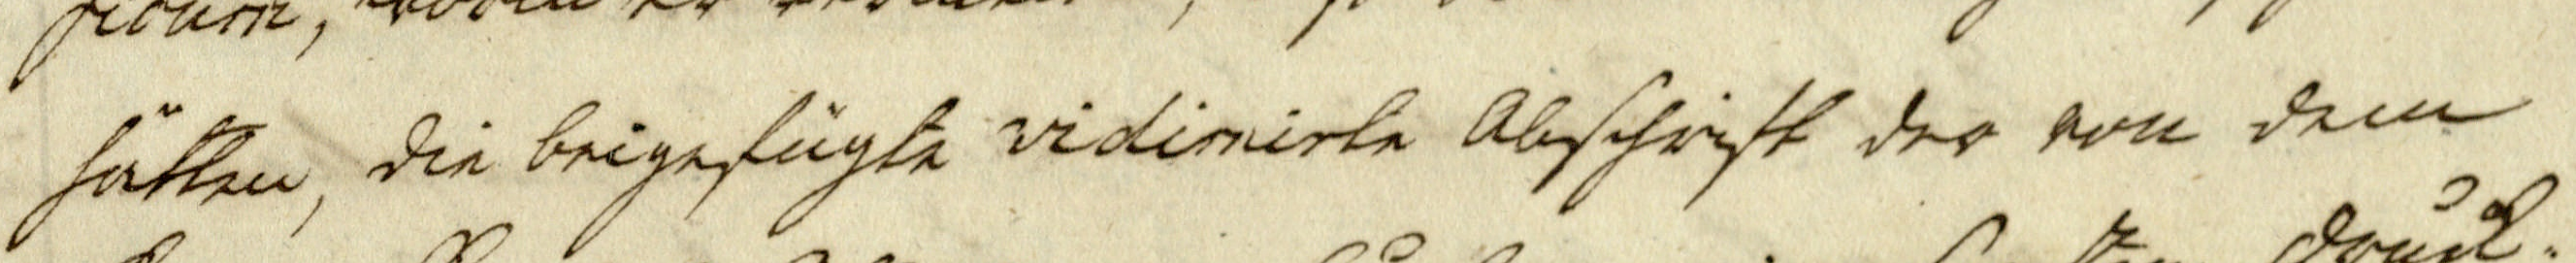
hätten, die geigefügte vidimirte Abschrift der von dem
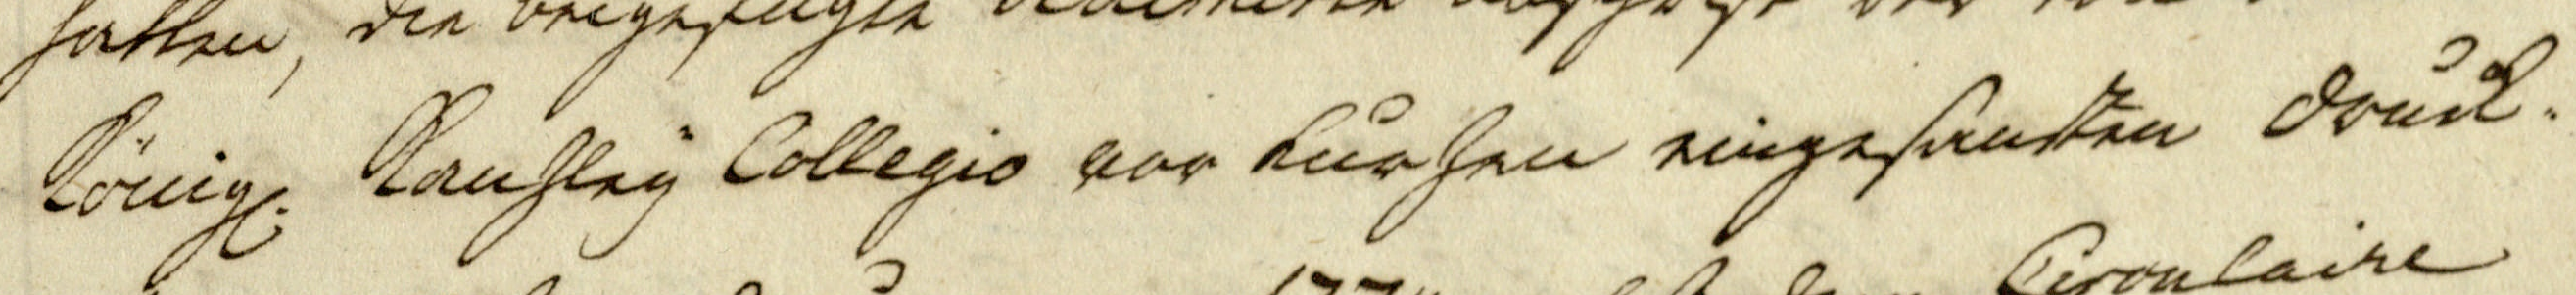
Königl. Kanzleÿ Collegio vor kurzen eingesandten Druck¬
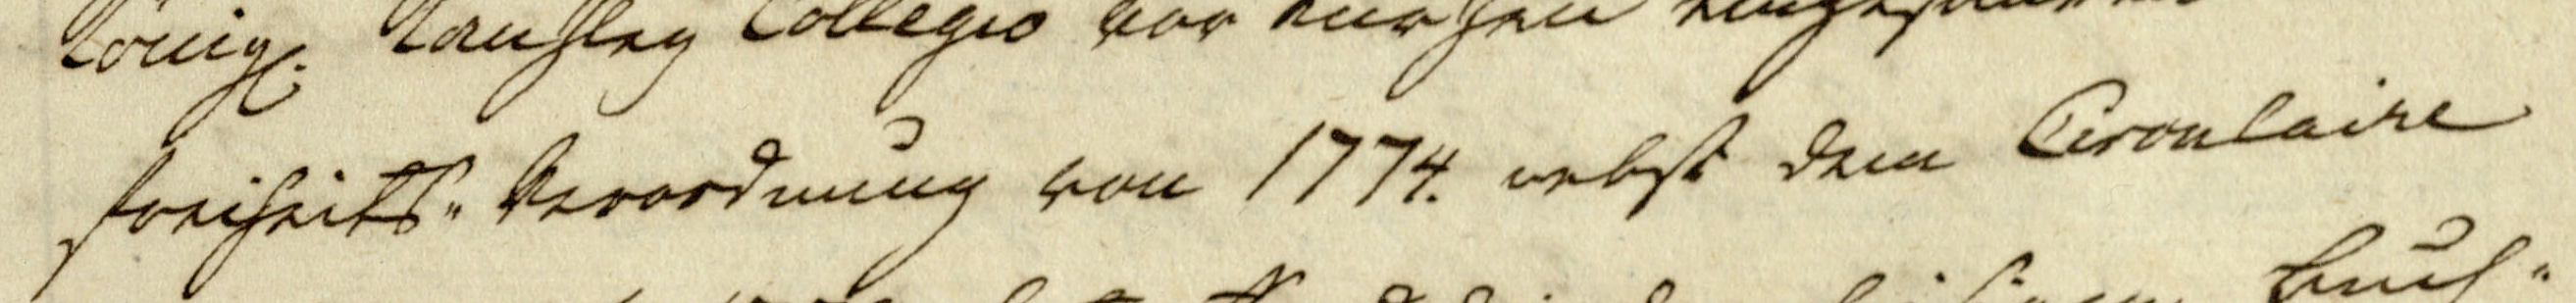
freiheits Verordnung von 1774. nebst dem Circulaire
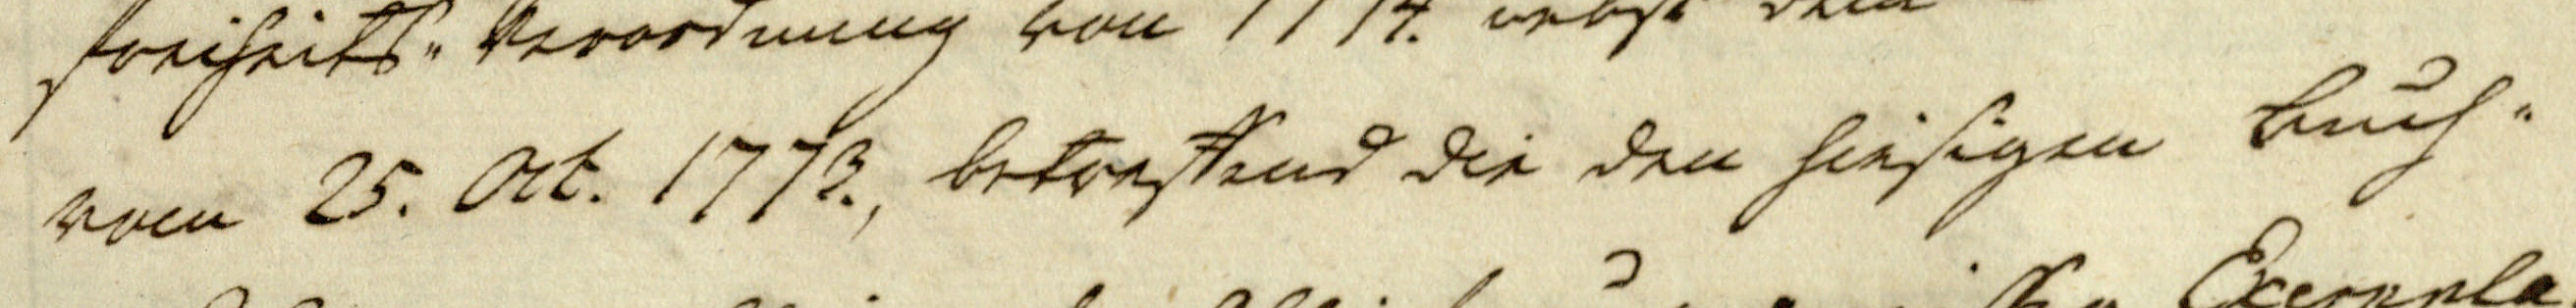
vom 25. Oct. 1773. betreffend die den hiesigen Buch¬
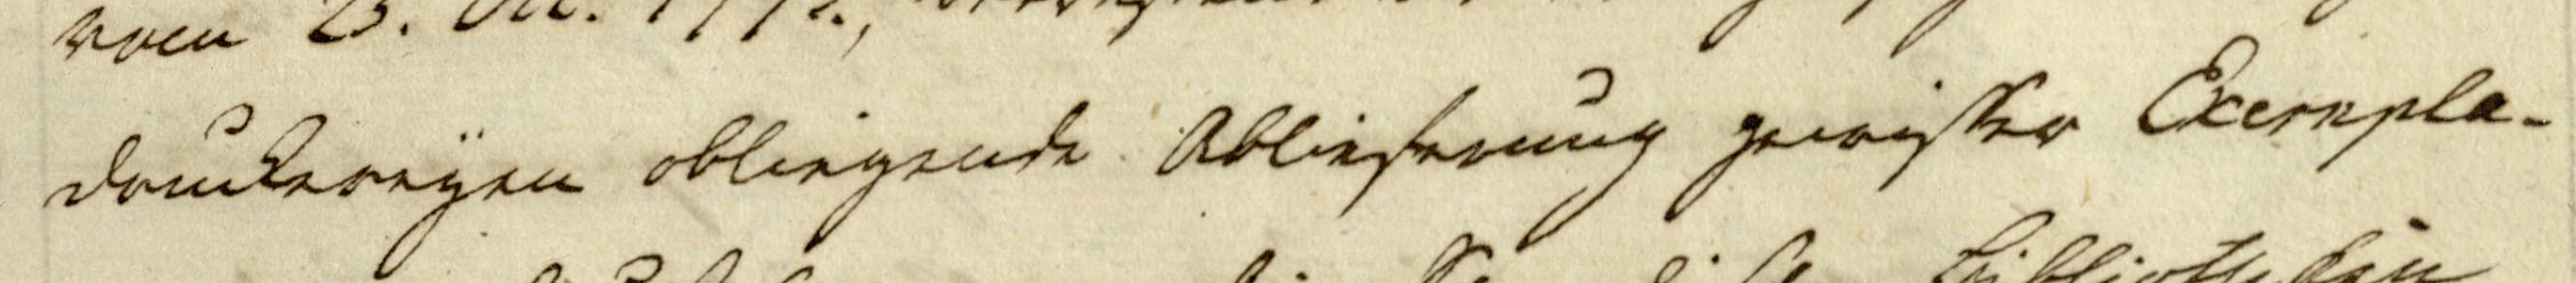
druckereÿen obliegende Ablieferung gewisser Exempla¬
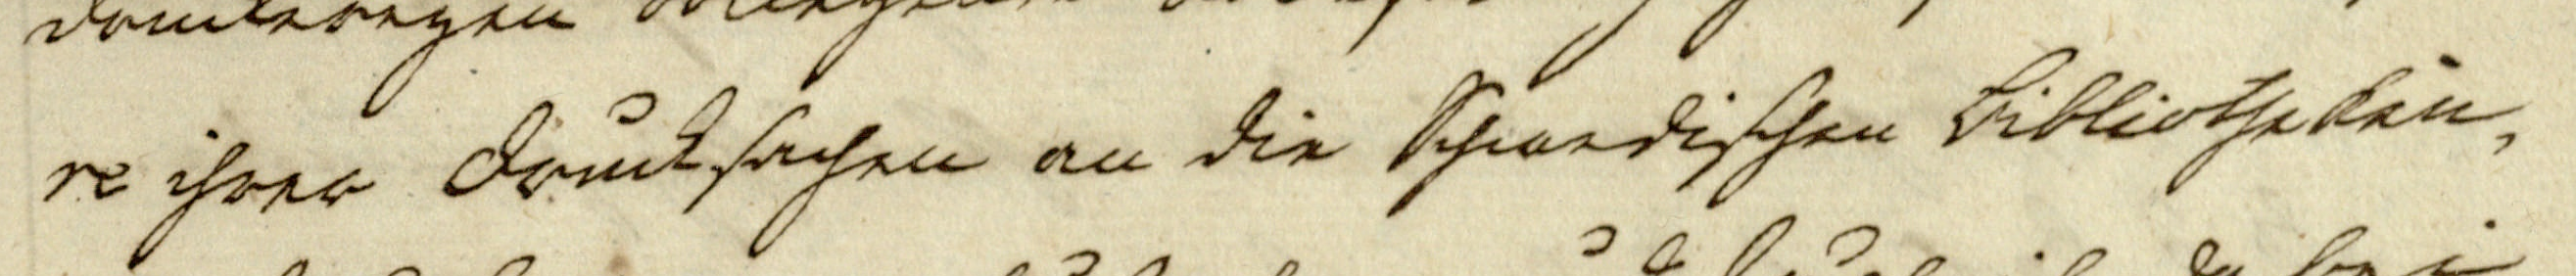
re ihrer Drucksachen an die Schwedischen Bibliotheken,
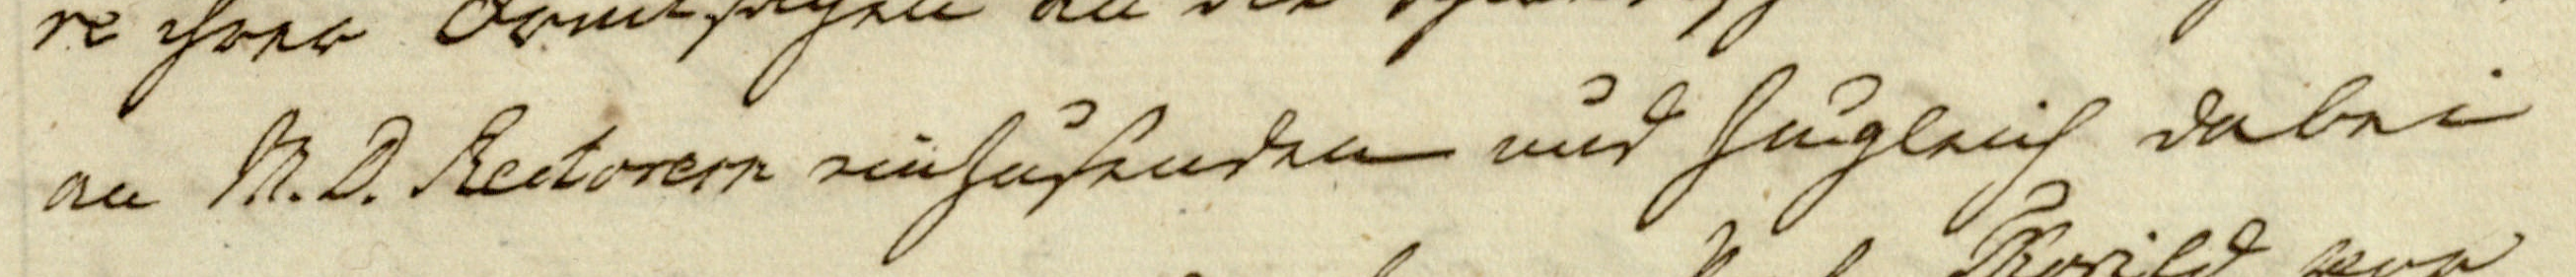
an M. D. Rectorem einzusenden und zugleich dabei
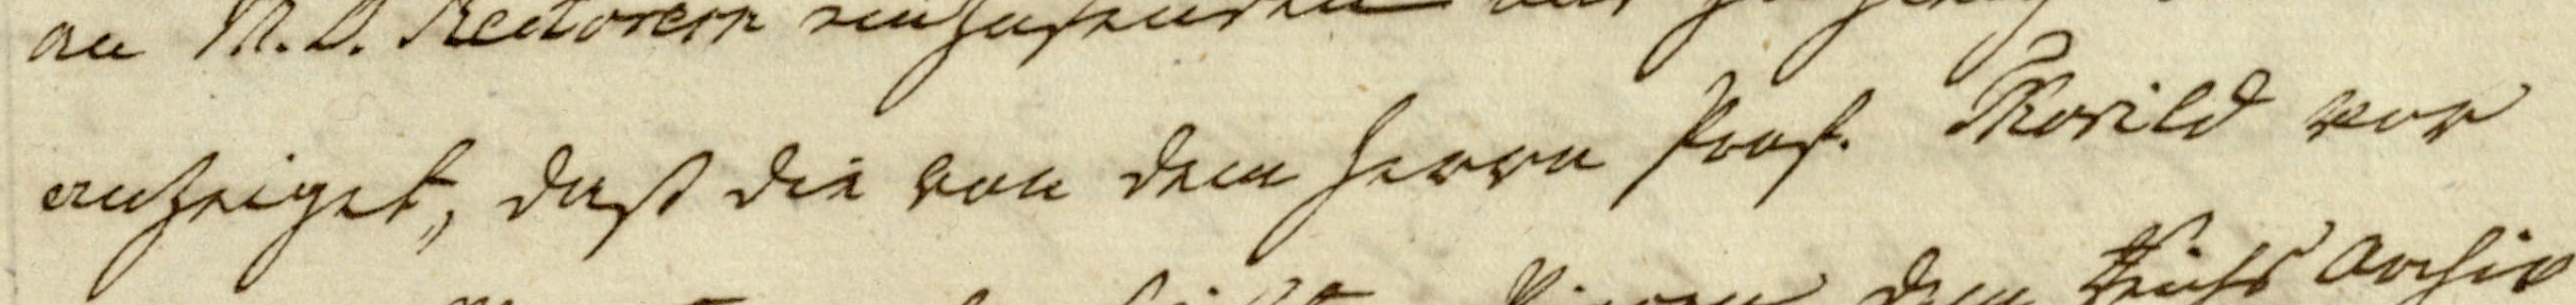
angezeiget, daß die von dem herrn Prof. Thorild vor
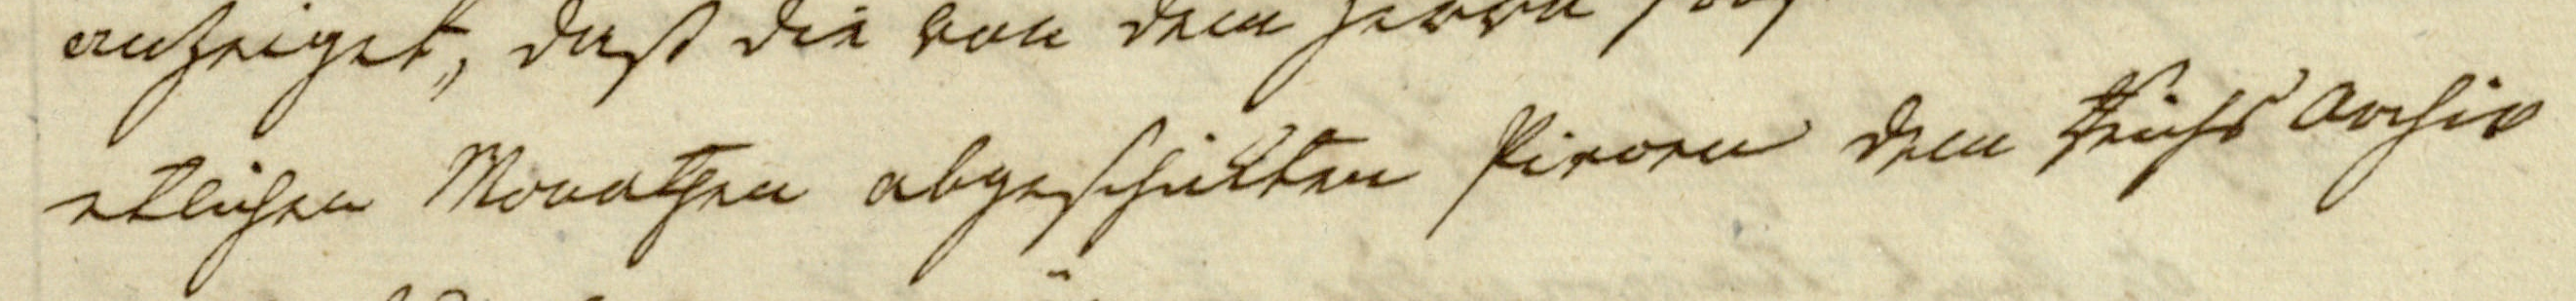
etlichen Monathen abgeschickten Piecen dem Reichs Archiv
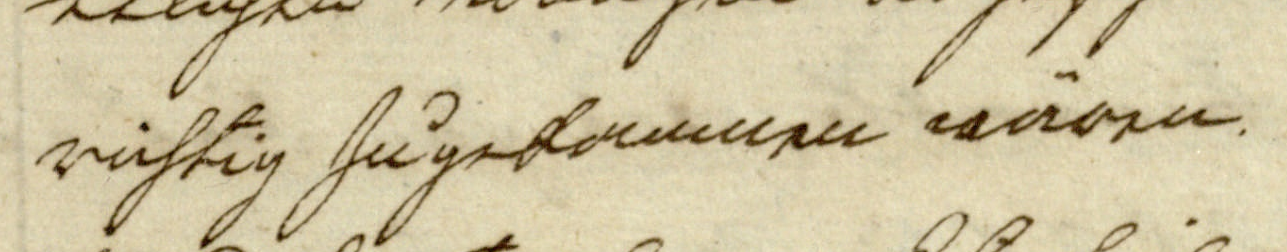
richtig zu gekommen wären.
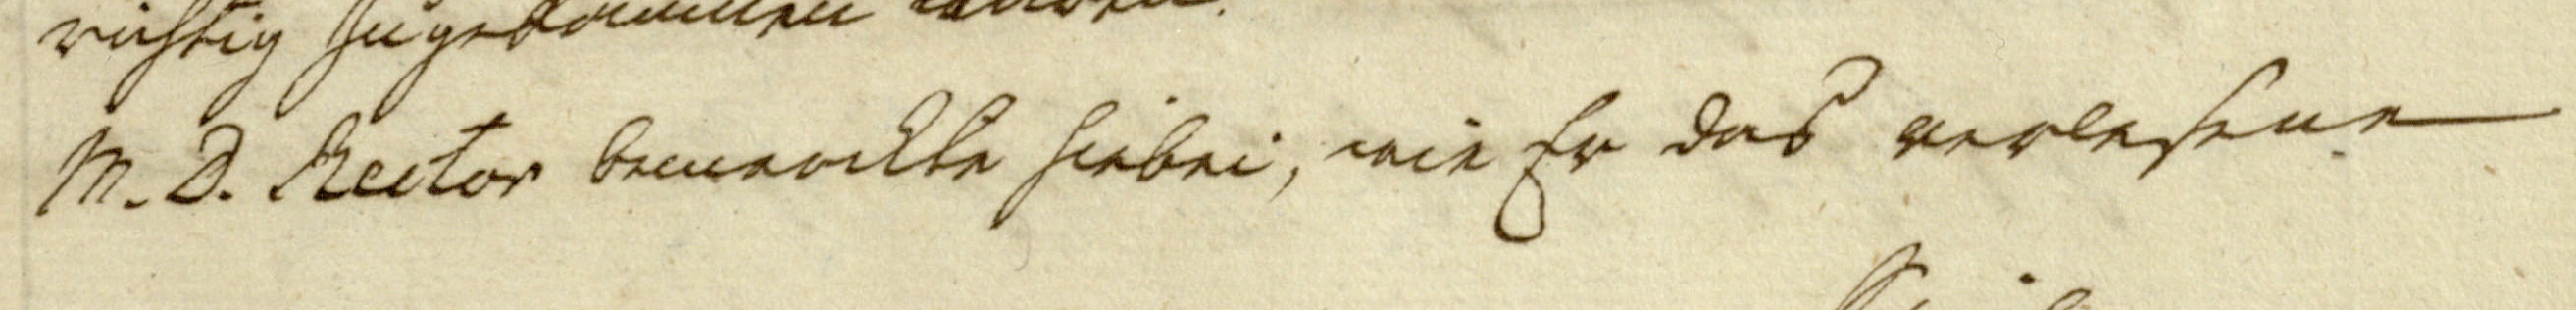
M. D. Rector bemerckte hiebei, wie Er das verlesene
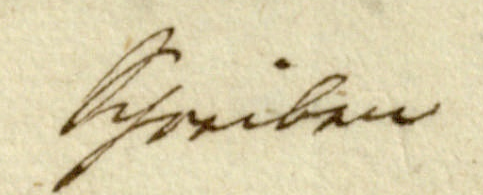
Schreiben
